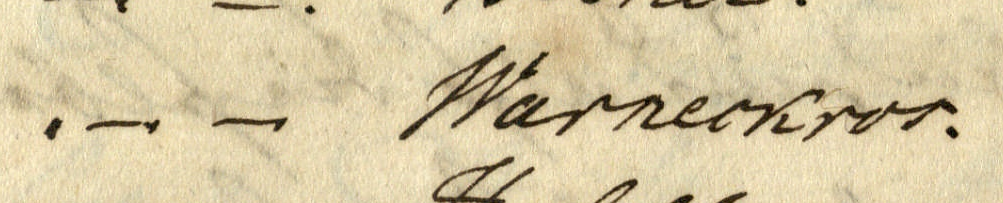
" - " - " Warneckros.
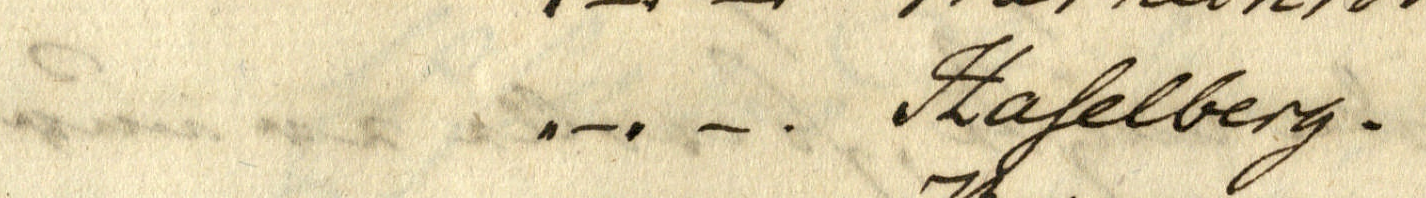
" - "- " Haselberg.
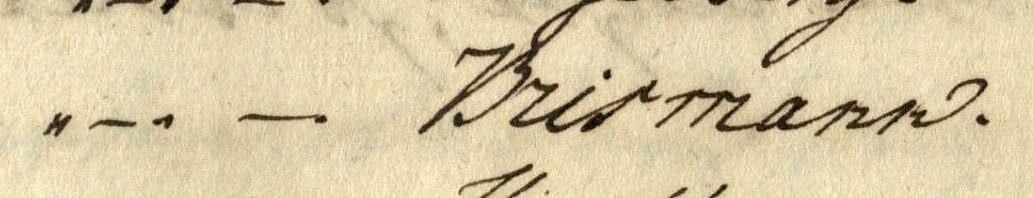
" - "- " Brismann.
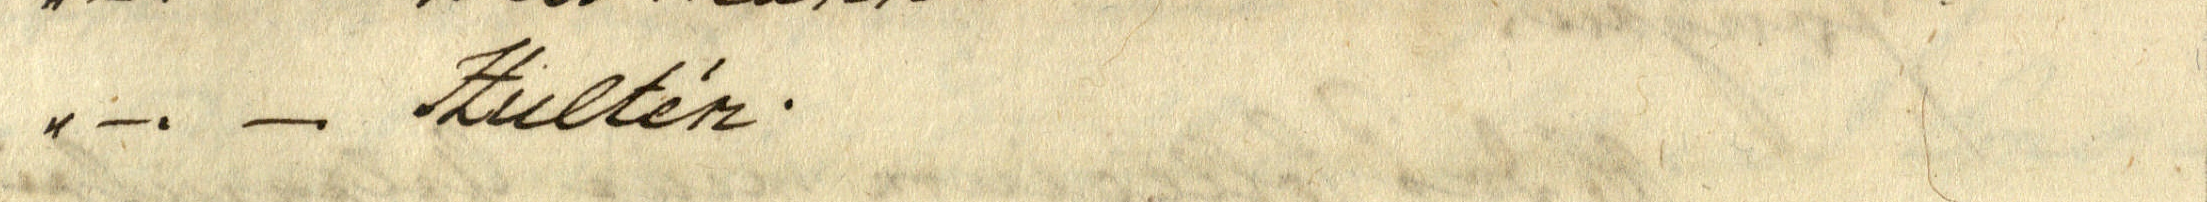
" - " - Hultén.
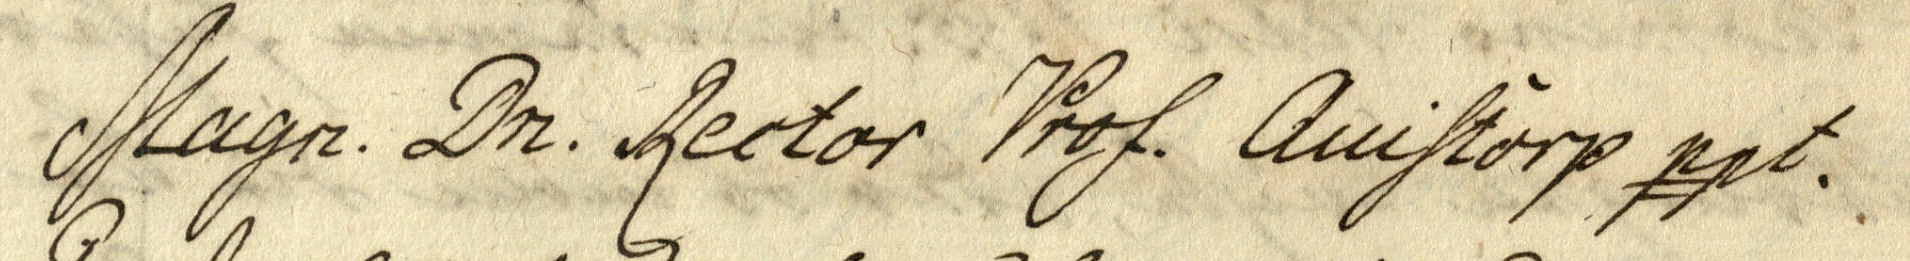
Magn. Dn. Rector Prof. Quistorp ppt.
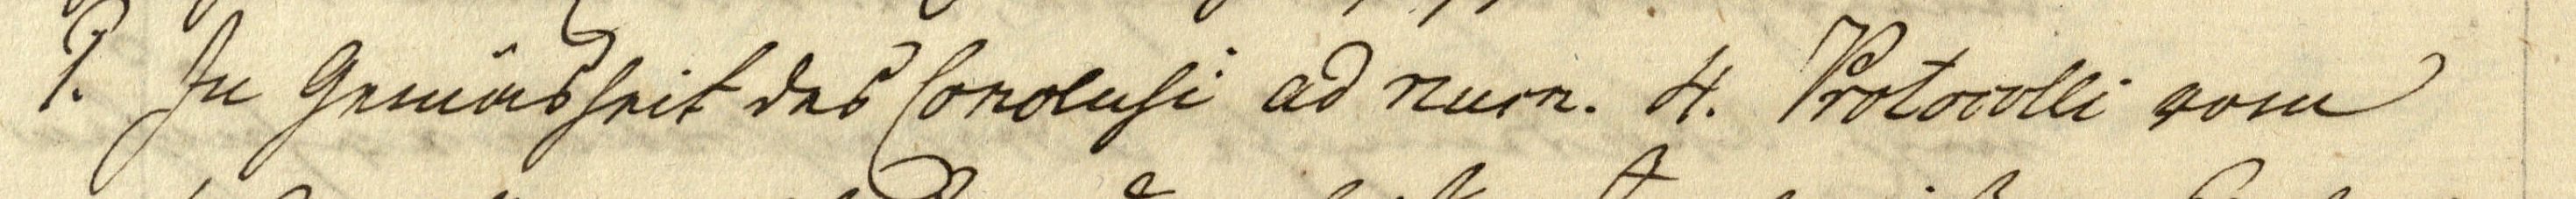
1.) In Gemäsheit des Conclusi ad num. 4 Protocolli vom
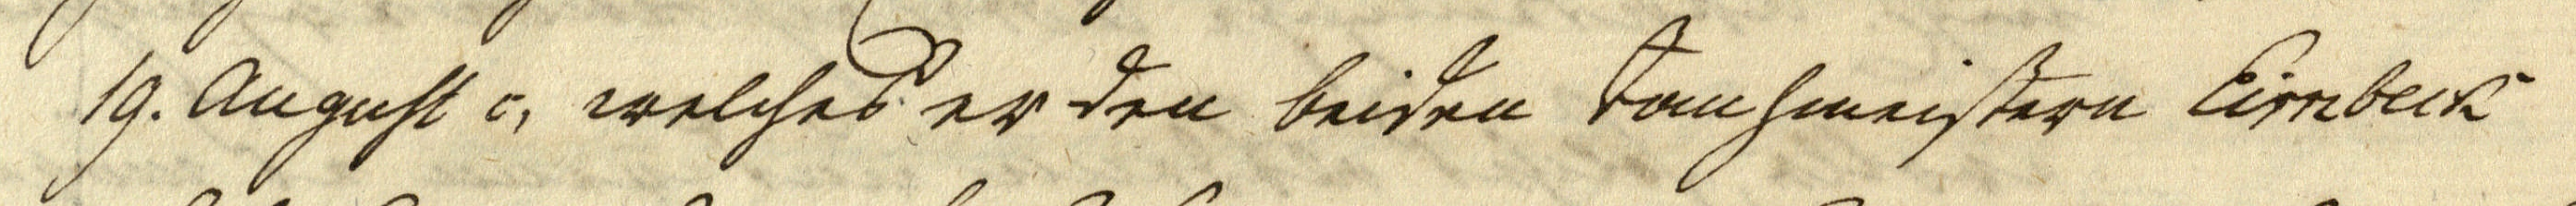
19. August c, welches er den beiden Tanzmeistern Eimbeck
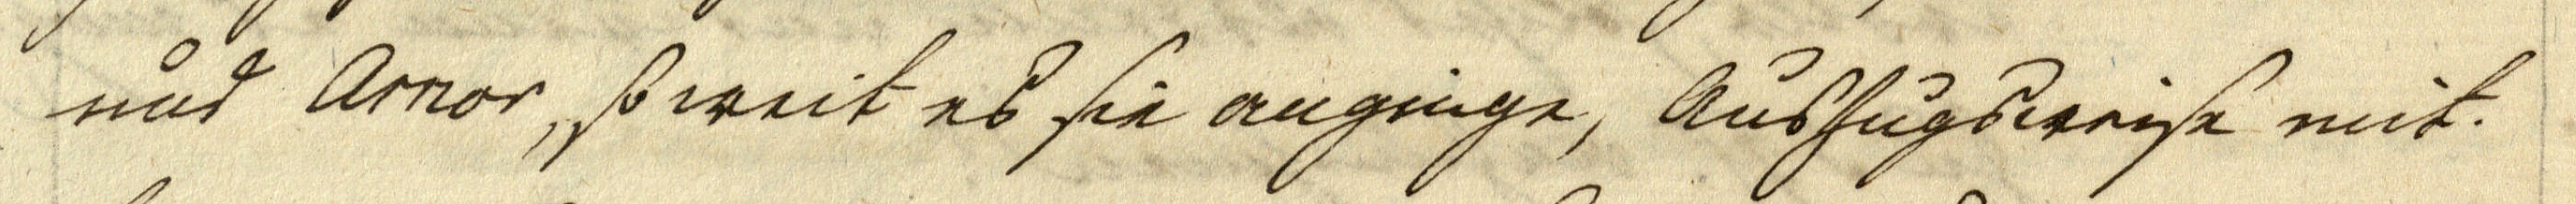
und Amor, so weit es sie anginge, auszugsweise mit-
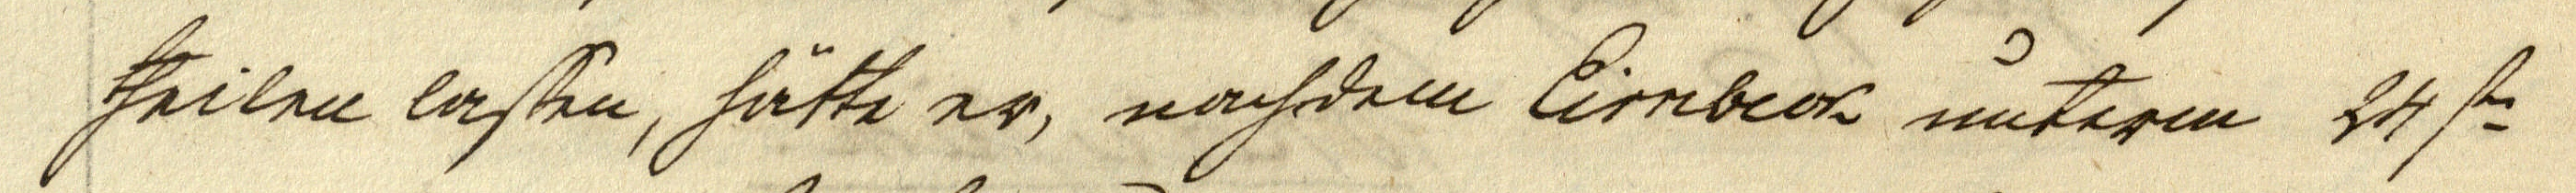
theilen lassen, hätte er, nachdem Eimbeck unterm 24sten
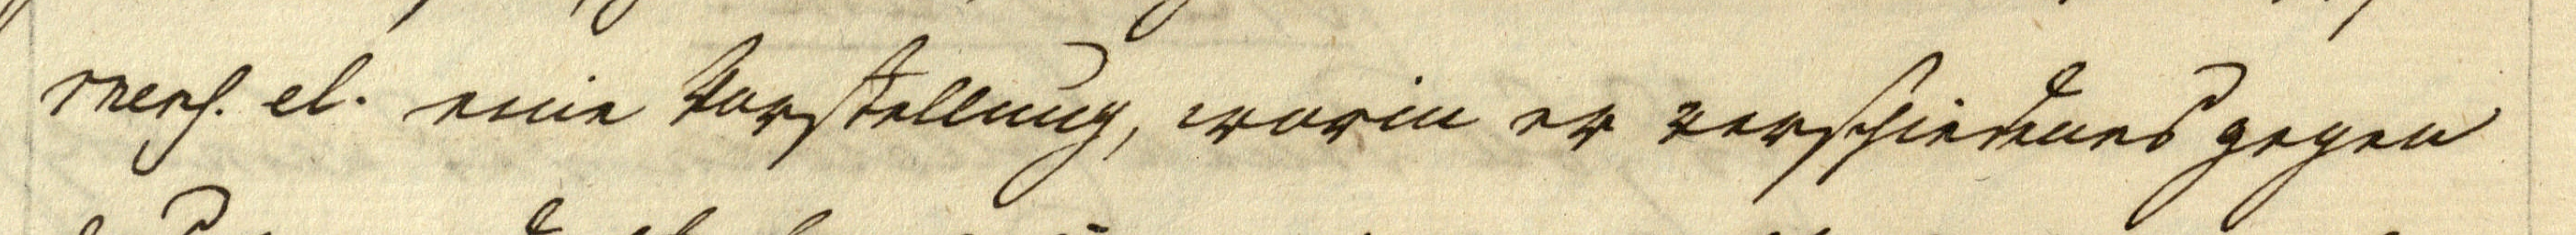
mens. el. eine Vorstellung, worin er verschiedenes gegen
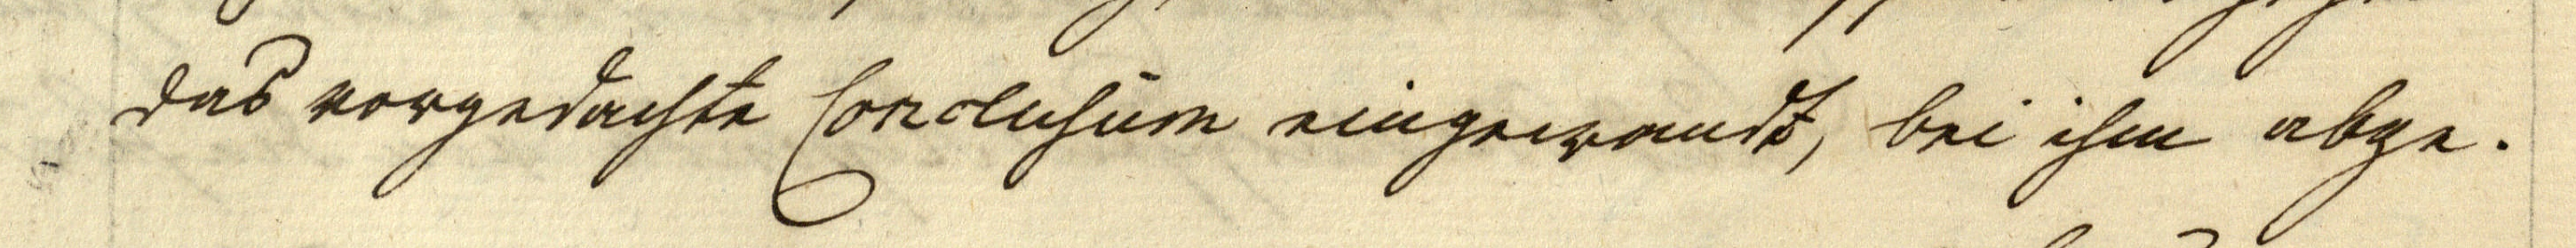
das vorgedachte Conclusum eingewandt, bei ihm abge-
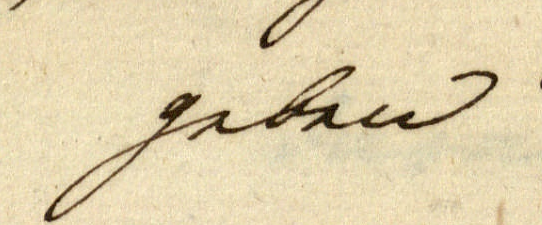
geben
